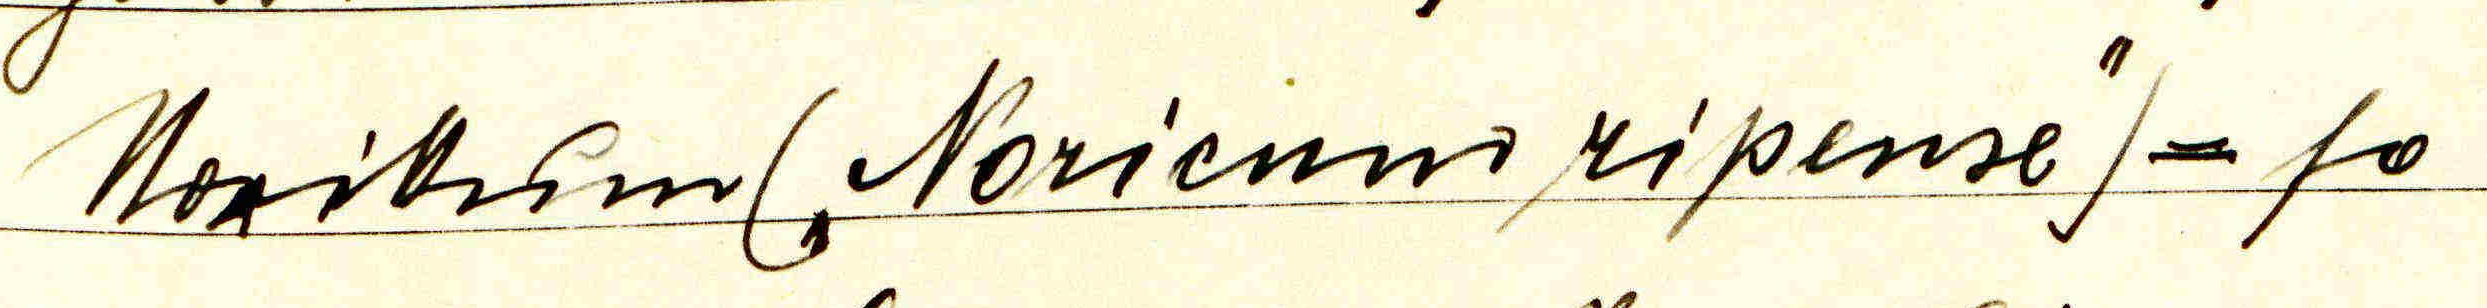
Norikum („Noricum ripense“) – so
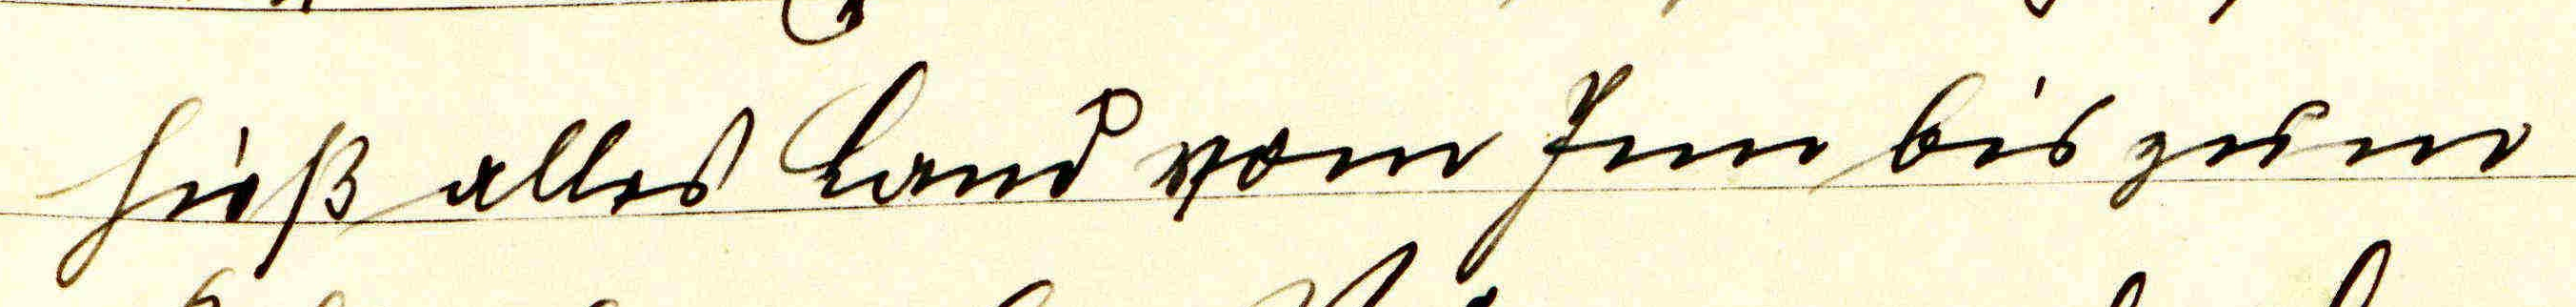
hieß alles Land vom Inn bis zum
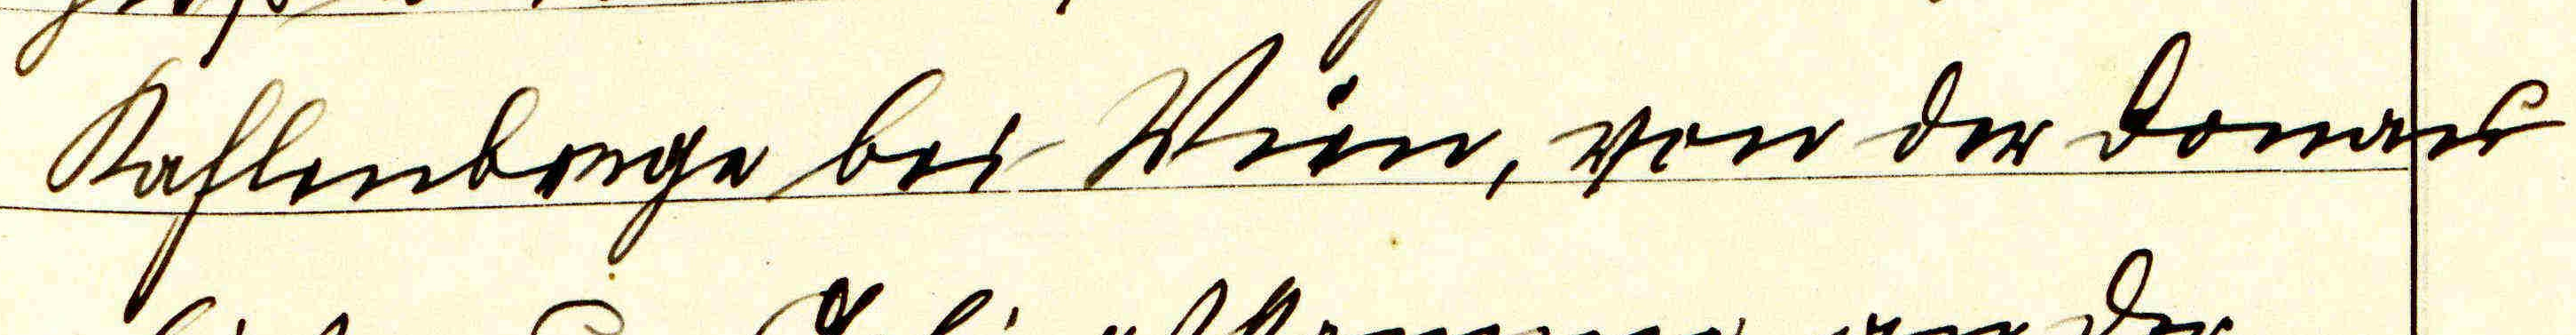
Kahlenberge bei Wien, von der Donau
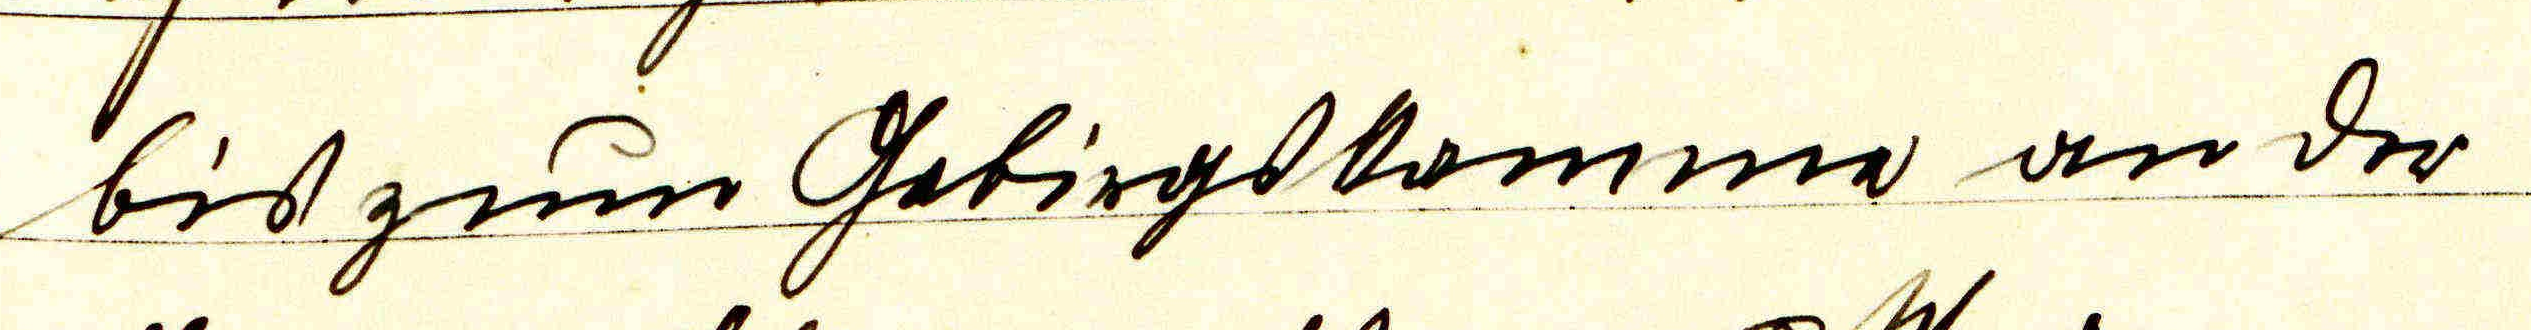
bis zum Gebirgskamme an der
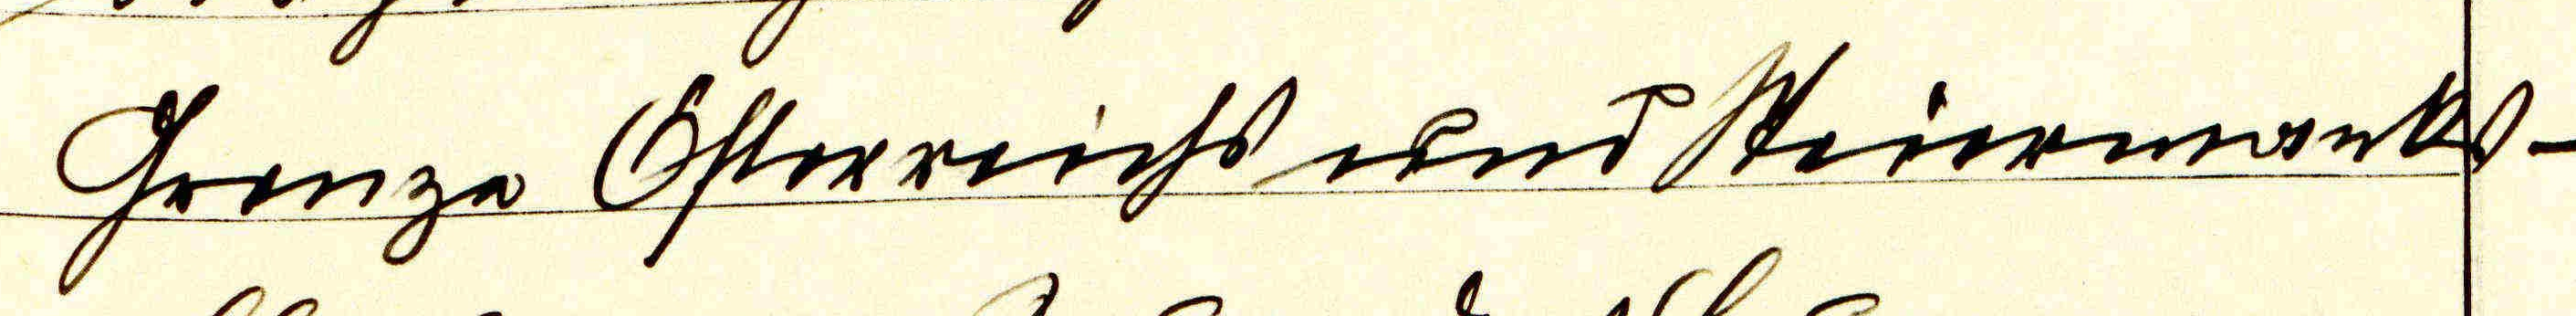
Grenze Österreichs und Steiermarks –
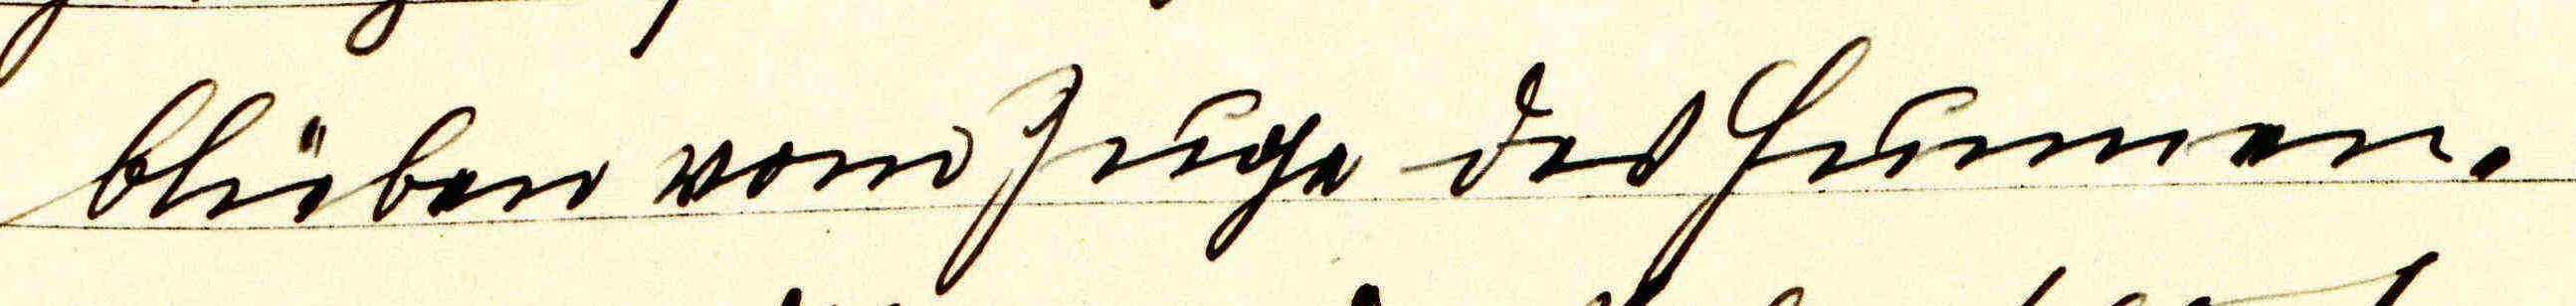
blieben vom Zuge des Hunnen-
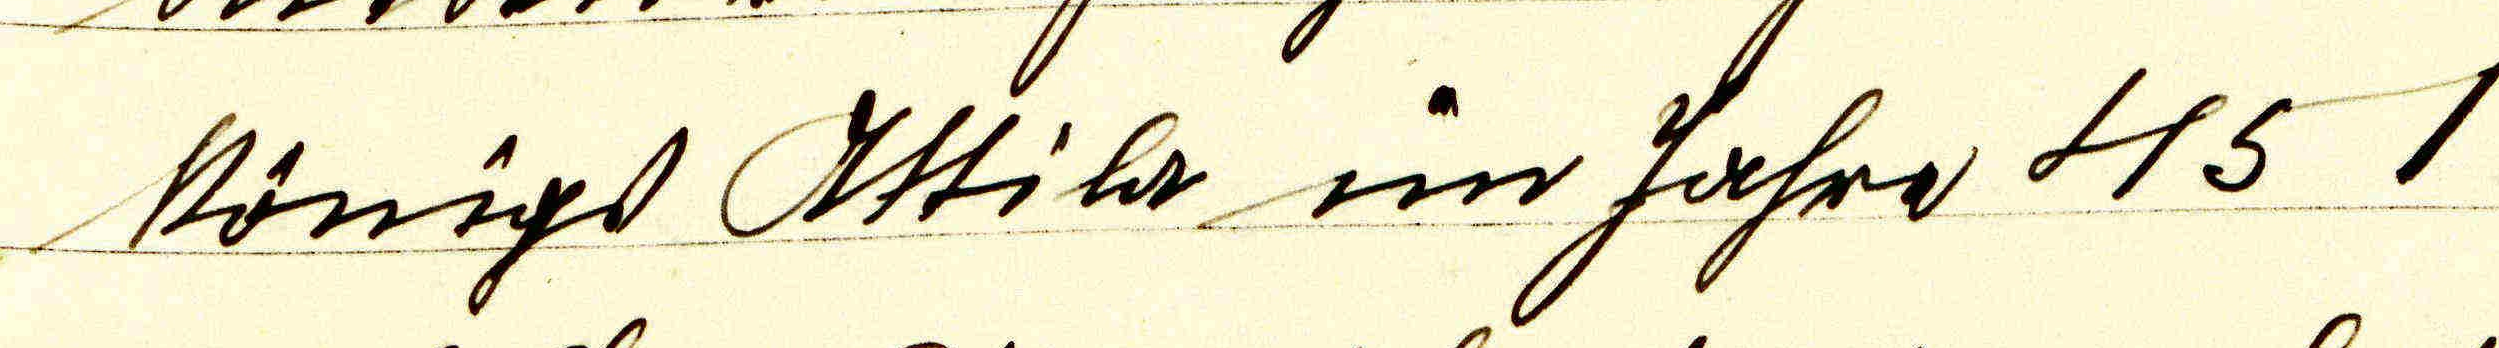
königs Attila im Jahre 451
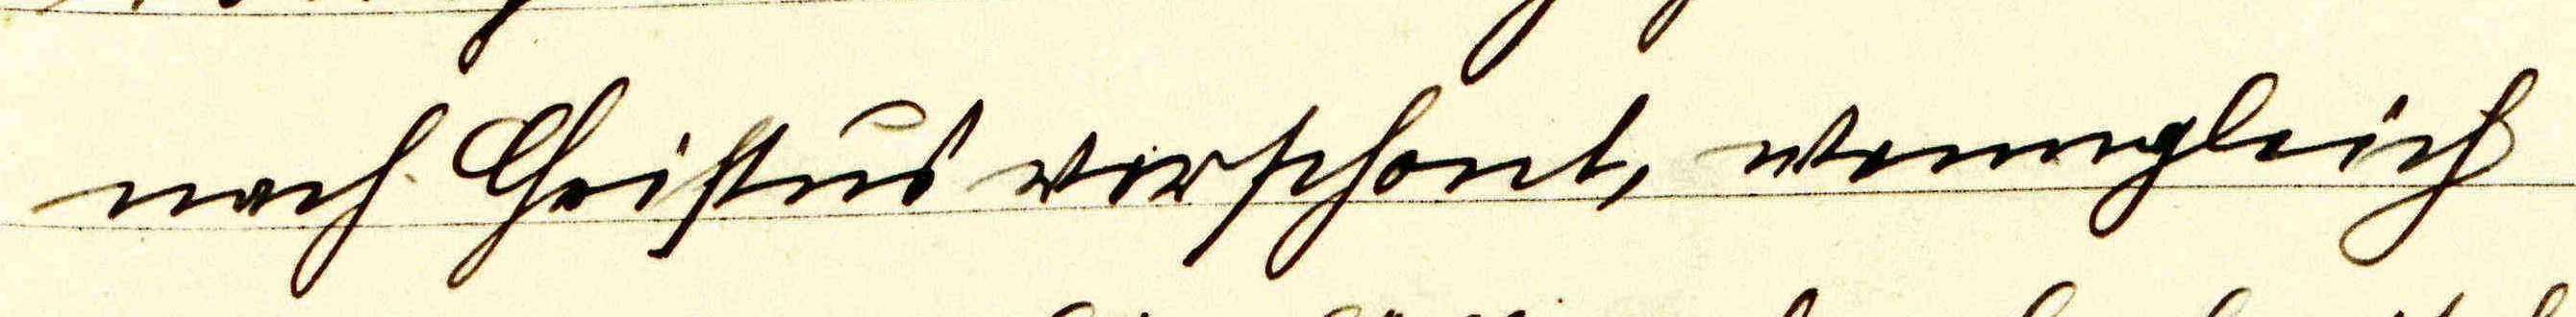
nach Christus verschont, wenngleich
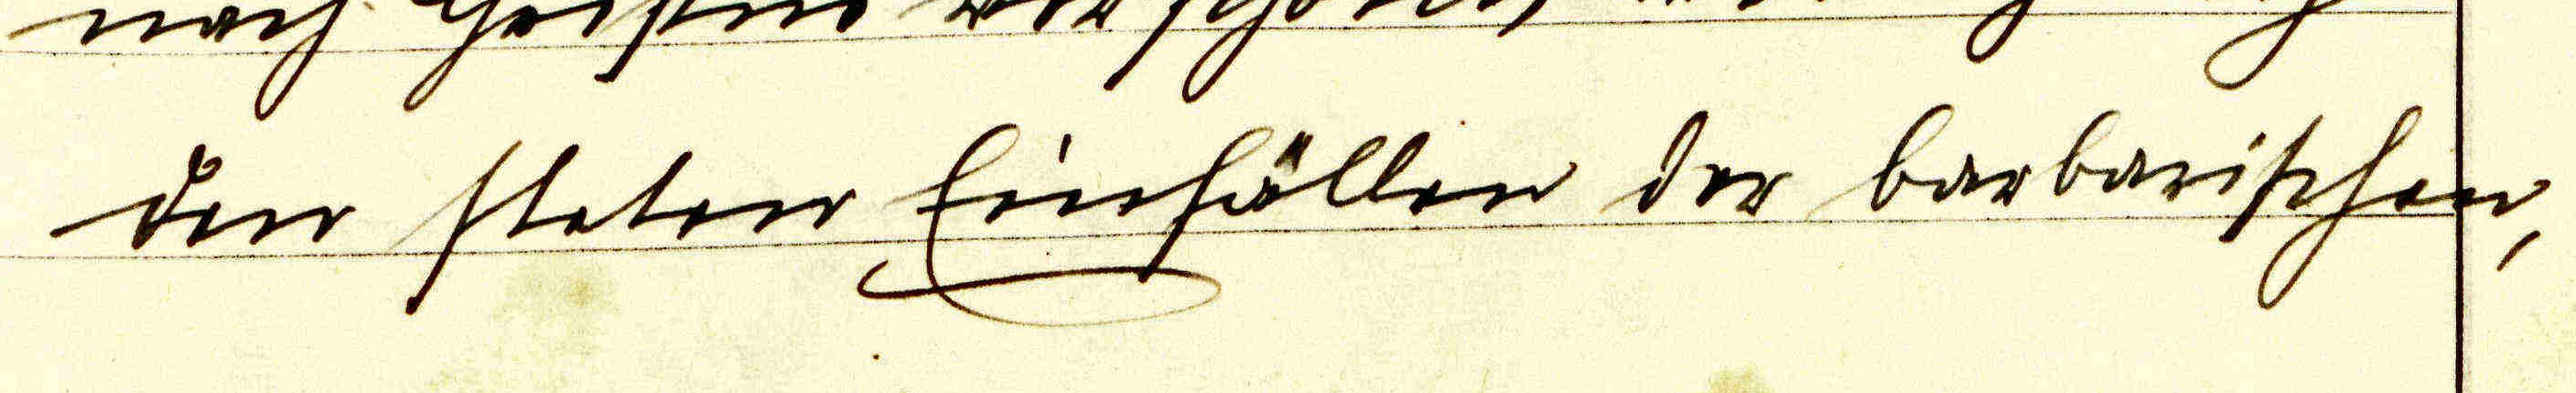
der steten Einfälle der barbarischen,
